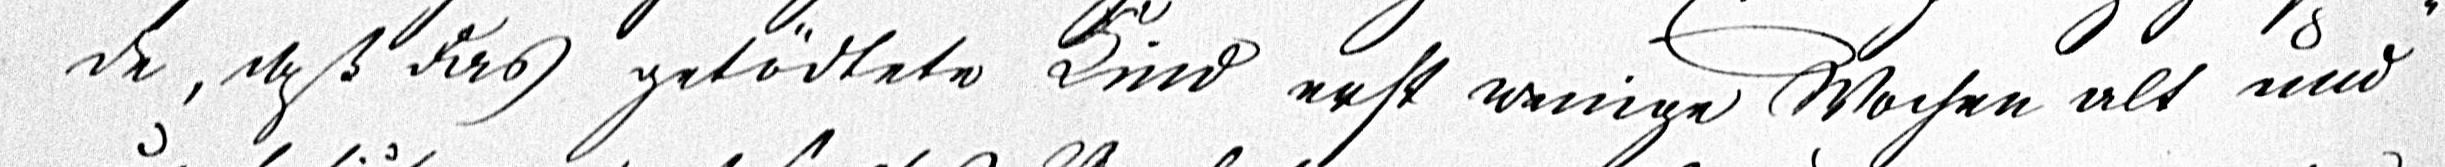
de, daß das getödtete Kind erst wenige Wochen alt und
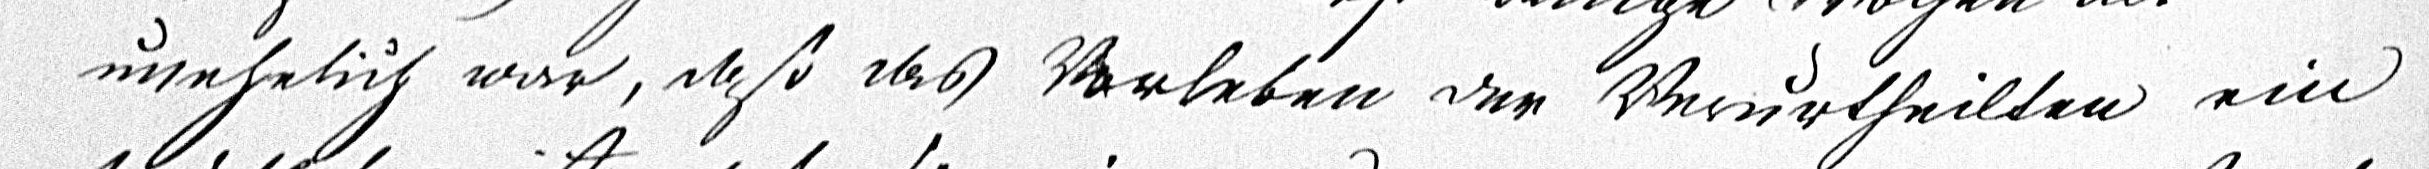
unehelich war, daß das Vorleben der Verurtheilten ein
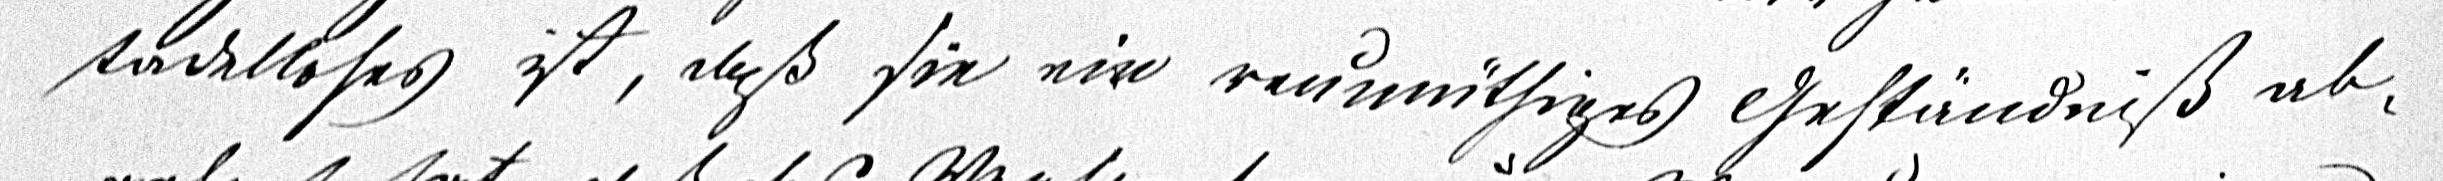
tadelloses ist, daß sie ein reumüthiges Geständniß ab¬
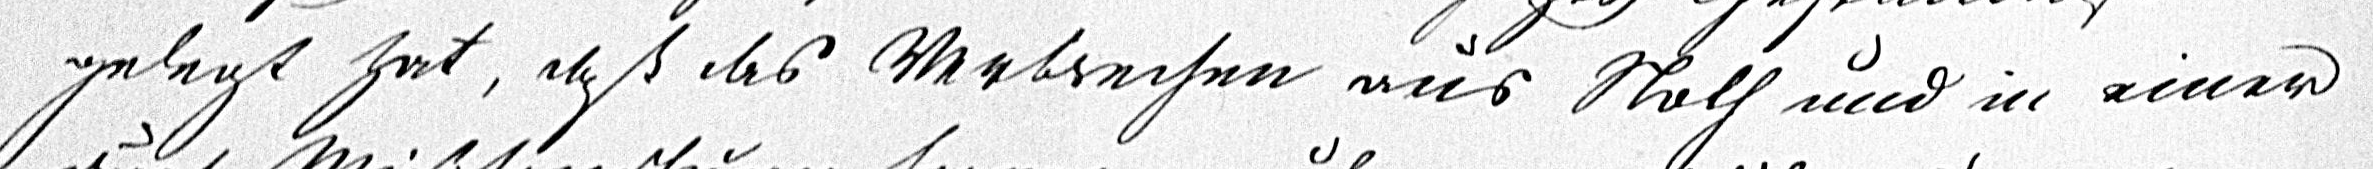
gelegt hat, daß das Verbrechen aus Noth und in einer
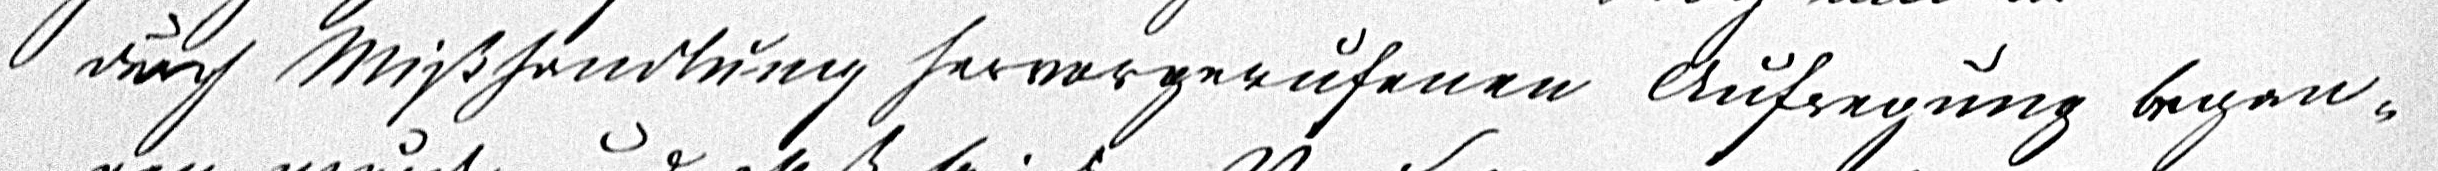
durch Mißhandlung hervorgerufenen Aufregung began¬
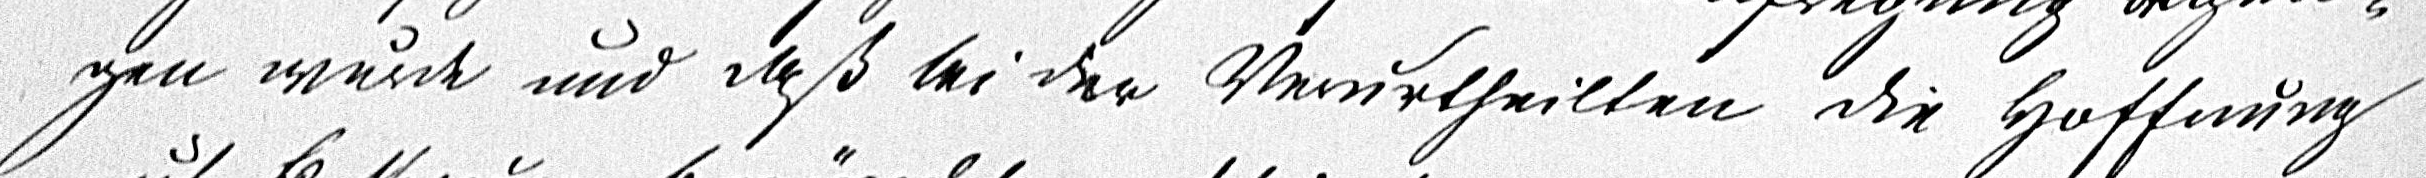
gen wurde und daß bei der Verurtheilten die Hoffnung
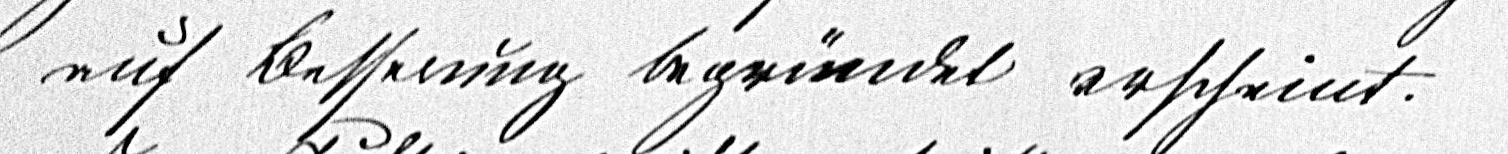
auf Besserung begründet erscheint.
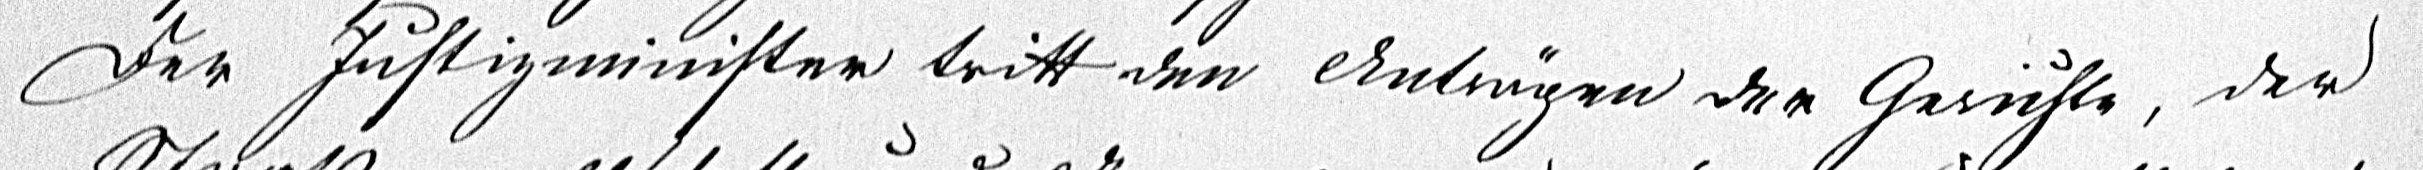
Der Justizminister tritt den Anträgen der Gerichte, der
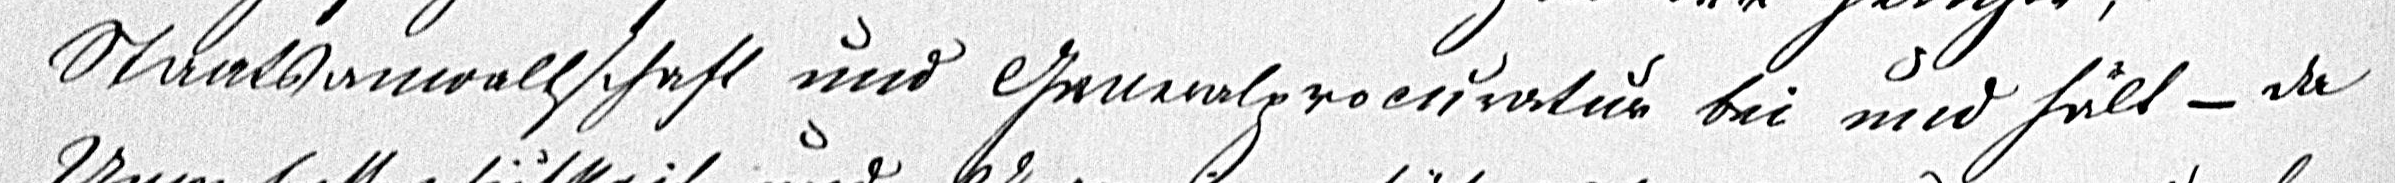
Staatsanwaltschaft und Generalprocuratur bei und hält - da
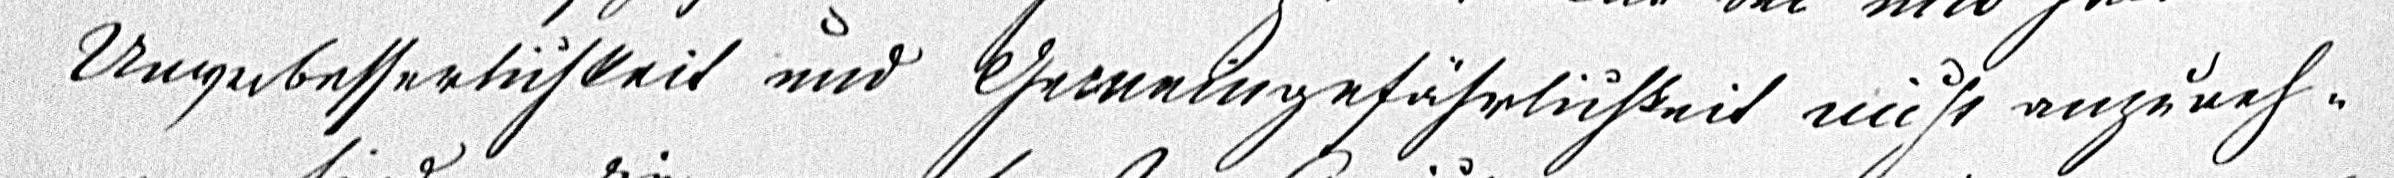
Unverbesserlichkeit und Gemeingefährlichkeit nicht anzuneh¬
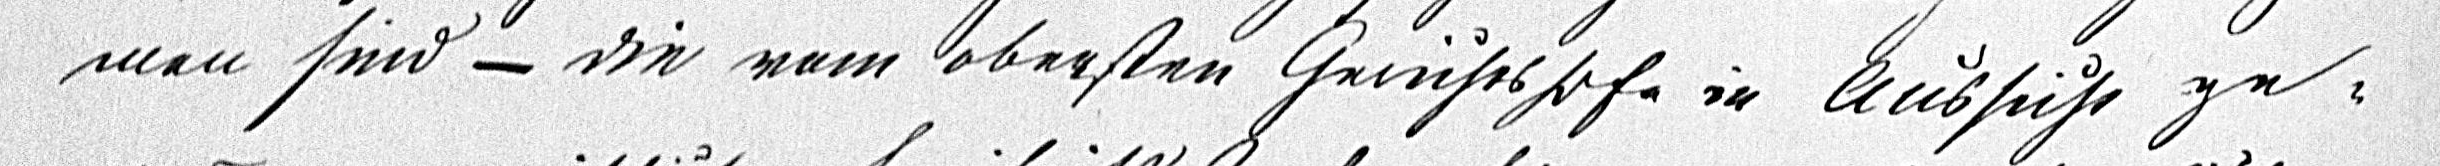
men sind - die vom obersten Gerichtshofe in Aussicht ge¬
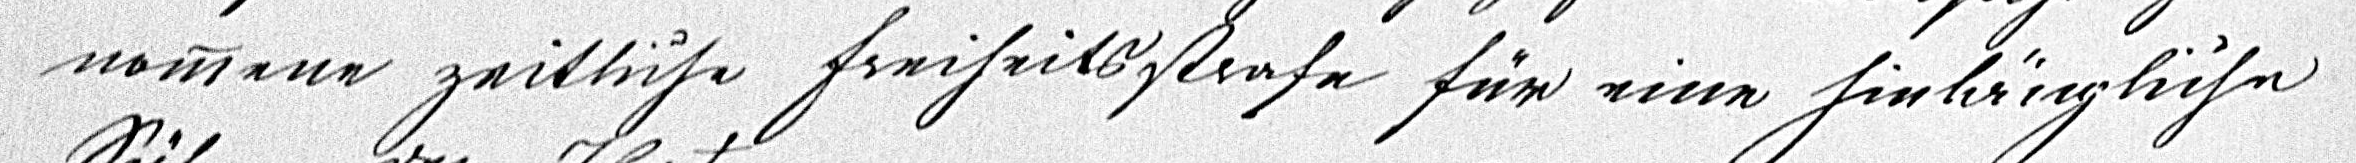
nommene zeitliche Freiheitsstrafe für eine hinlängliche
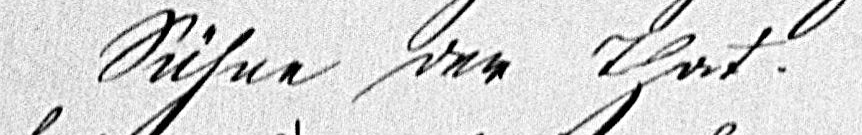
Sühne der That.
